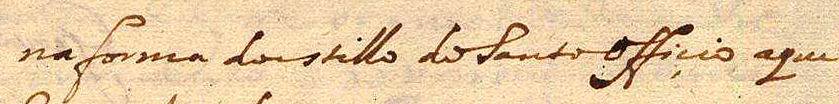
na forma do estillo do Santo officio a que
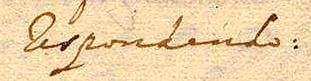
Respondendo:
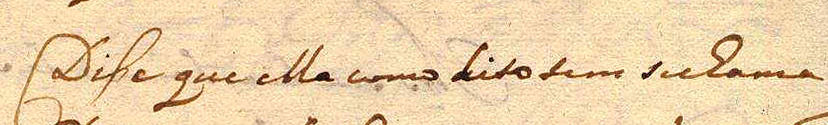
Disse que ella como dito tem se chama
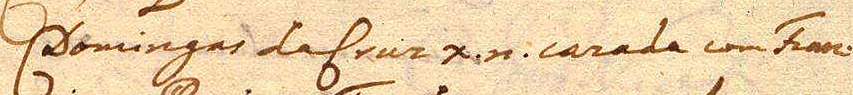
Domingas da Cruz x. n. cazada com Fran
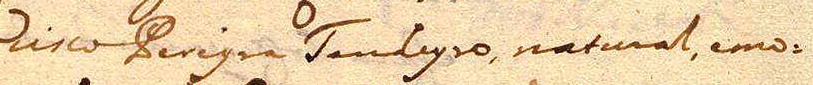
cisco Pereyra Tendeyro, natural, e mo
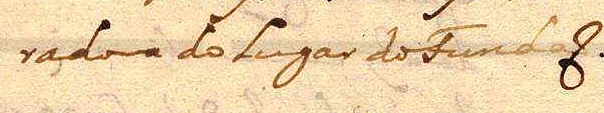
radora do Lugar do Fundaõ.
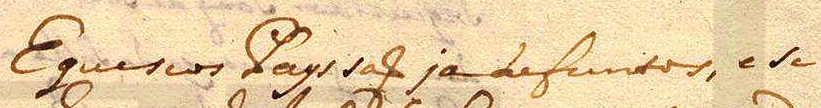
E que seos Pays saõ ja defuntos, e se
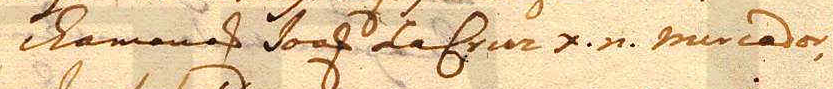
chamauaõ Ioaõ da Cruz x. n. mercador,
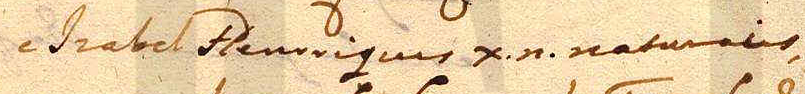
e Izabel Henrriques x. n. naturais,
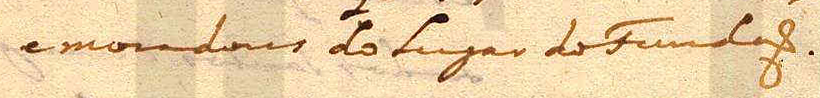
e moradores do Lugar do Fundaõ.
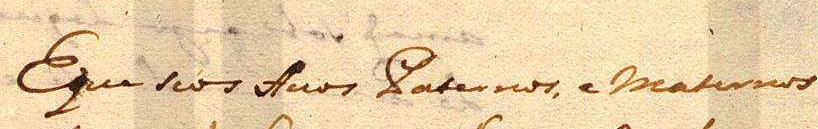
E que seos Auos Paternos, e maternos
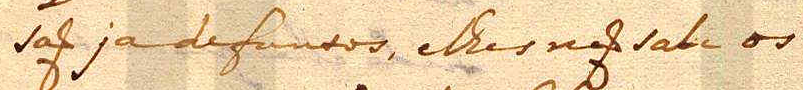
saõ ja defuntos, e lhes naõ sabe os
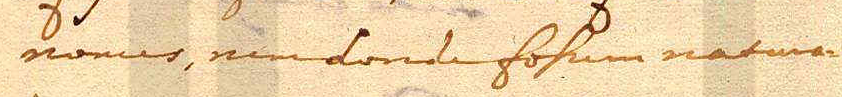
nomes, nem donde fossem natura
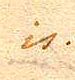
es.
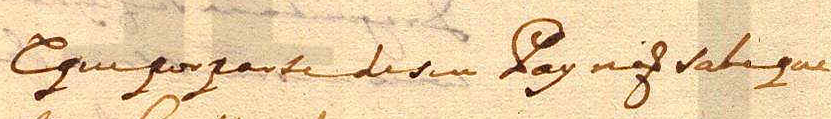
E que por parte de seu Pay naõ sabe que
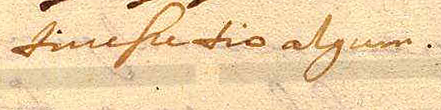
tiuesse tio algum.
